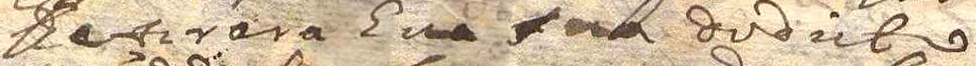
lhe tirara hua sua do dicto
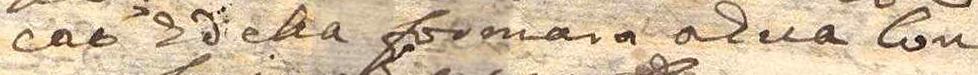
caõ E della formara a hua Con
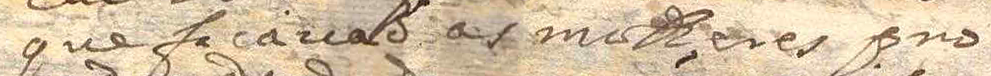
que ficauaõ as molheres pro
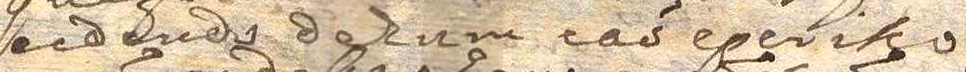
cedendo de hum caõ e per isso
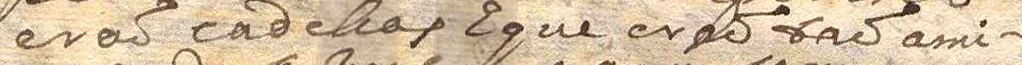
eraõ cadellas E que eraõ taõ ami
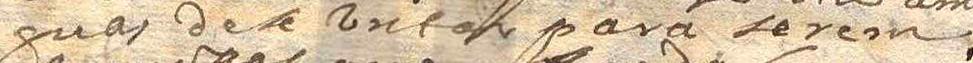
guas de se vntar para serem
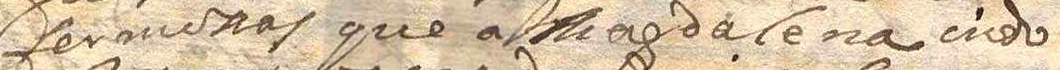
fermossas que a Magdalena indo
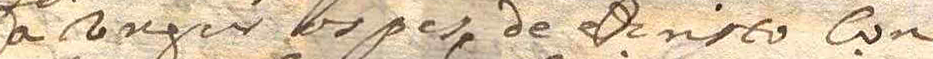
a vngir os pes de christo con
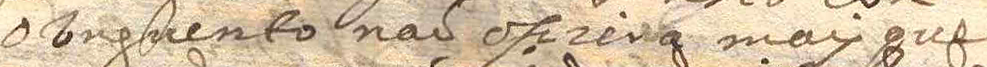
o vnguento naõ o fizera mais que
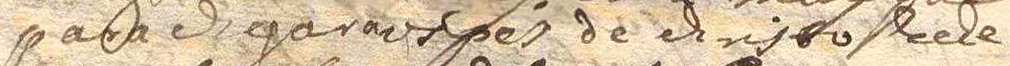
para chegar aos pes de christo E che
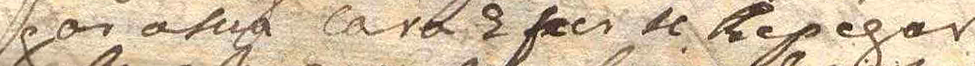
gar a sua cara E per se lhe pegar
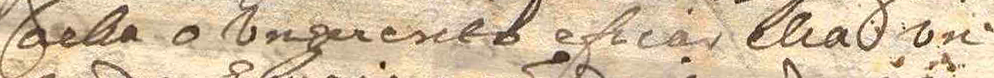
a ella o vnguento e ficar ella vn
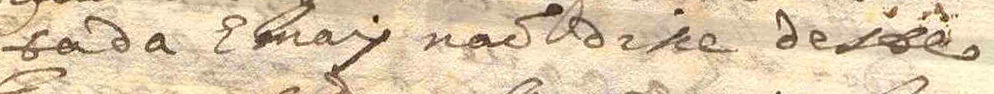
tada E mais naõ disse deste.
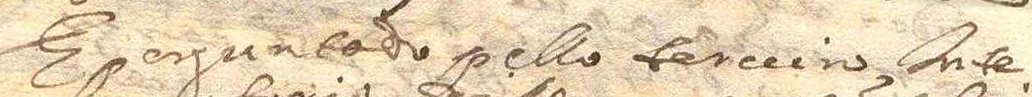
E perguntado pello terceiro Inte
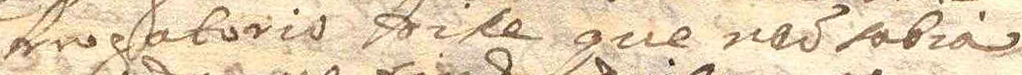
rrogatorio disse que naõ sabia
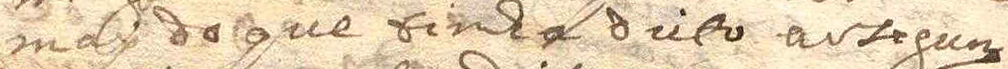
mais do que tinha dicto ao segun
